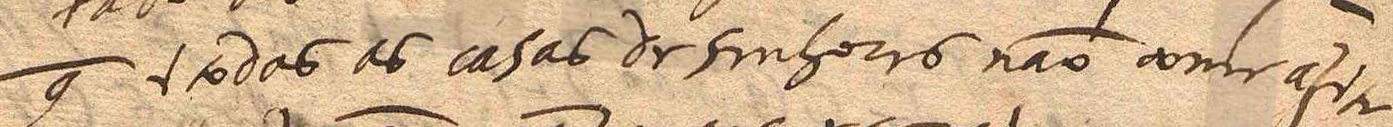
q̄ ē todas as casas de senhores não comer a Jēte
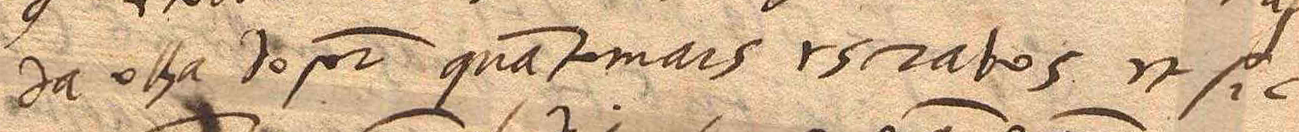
da olha do sōr quāto mais escravos et sic
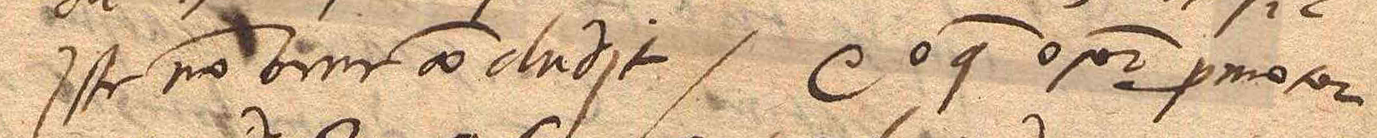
Jste n̄o bene cōcludjt / e o q̄ o sōr ꝓmotor
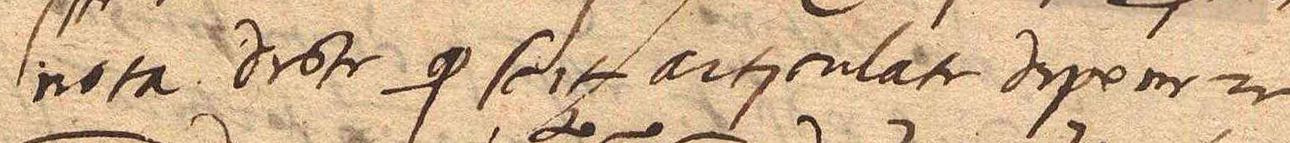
nota deste ꝙ scit artjculate deponere
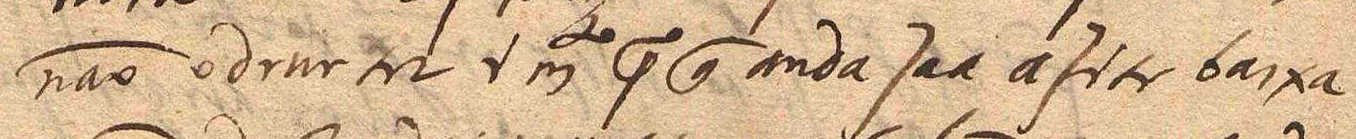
não o deue ter ē mto p̄oq̄ anda Jaa a Jēte baixa
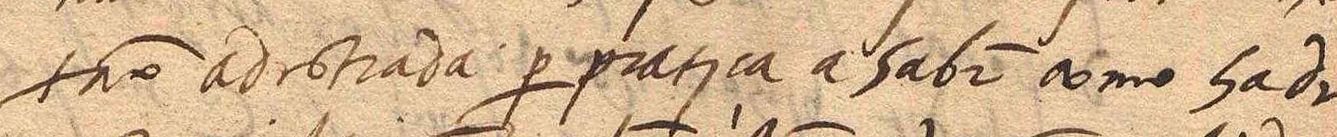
tão adestrada ꝑ pratjca a sabr̄ como ha de
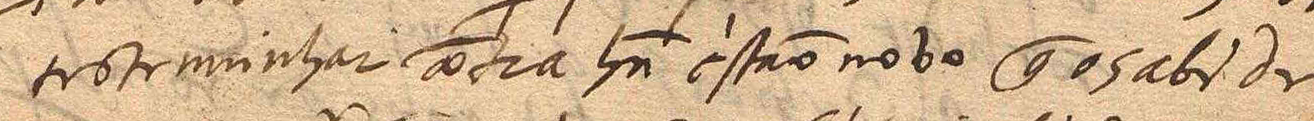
testemunhar cōtra hū cistão novo q̄ os sabē de
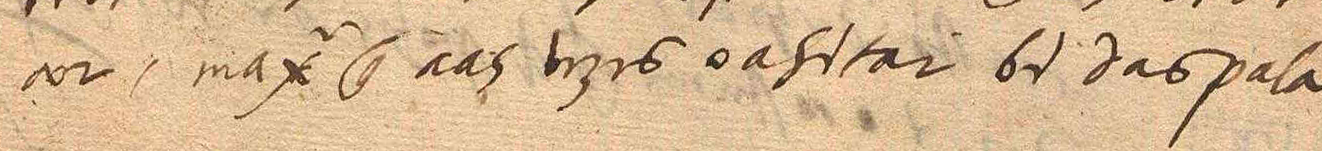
cor / max̄ q̄ aas vezes o asētar bē das pala
